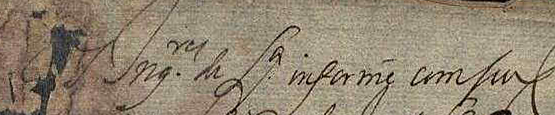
OS Inq.res de Lx.a informē com seu
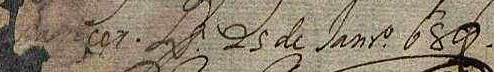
parecer. Lxa. 25 de Ianr.o 689.
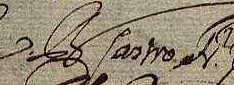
Castro Fr.
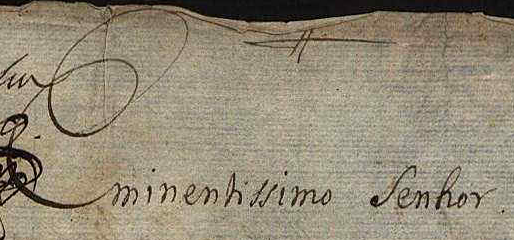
Eminentissimo Senhor
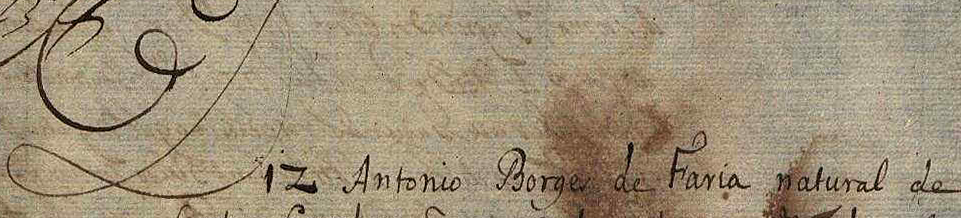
Diz Antonio Borges de Faria natural de
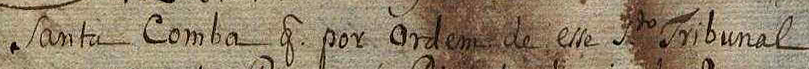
Santa Comba q̄. por ordem de esse S.to Tribunal
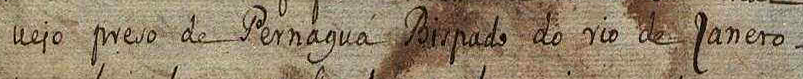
uejo preso de Pernaguá Bispado do rio de Janero
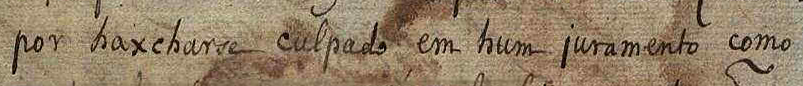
por haxcharse culpado em hum juramento como
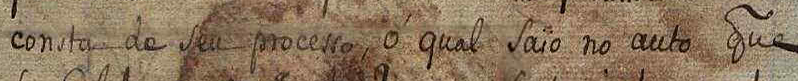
consta de seu processo, o qual saio no auto que
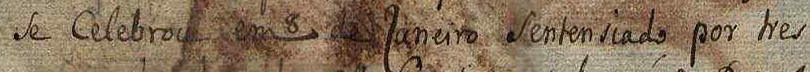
se Celebrou em 8 de Janeiro sentensiado por tres
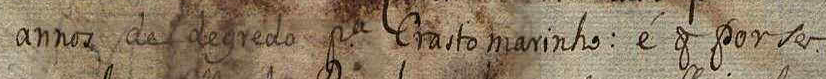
annos de degredo p.a Crasto marinho: e q̄ por ser
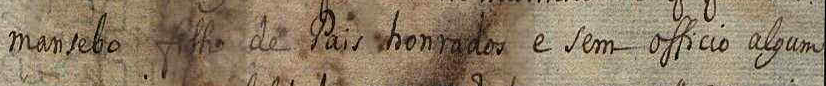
mansebo filho de Pais honrados e sem officio algum
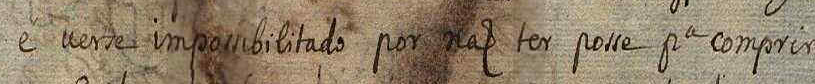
e uerse impossibilitado por naõ ter posse pa comprir
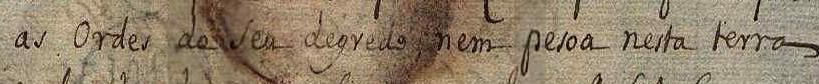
as Ordes de seu degredo; nem pesoa nesta terra
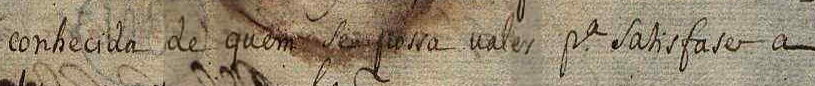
conhecida de quem se possa ualer p.a satisfaser a
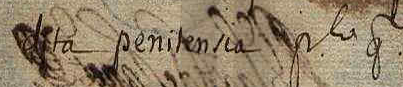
dita penitensia p.lo q̄.
